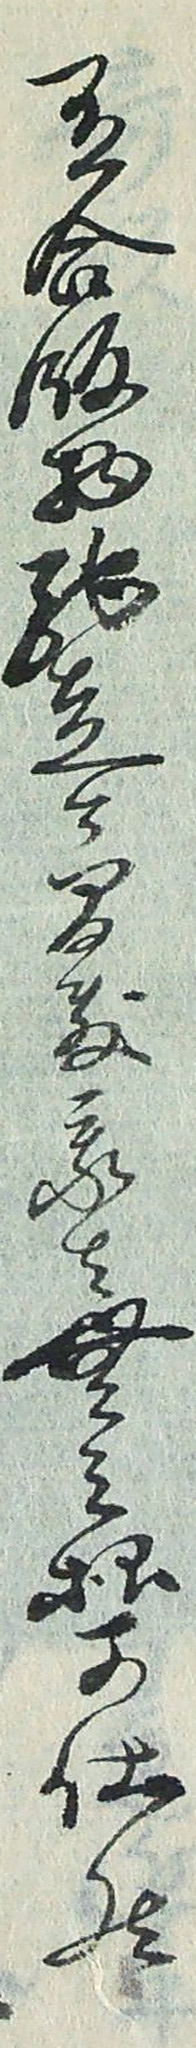有合飯物馳走ケ間敷義者無之様可仕候
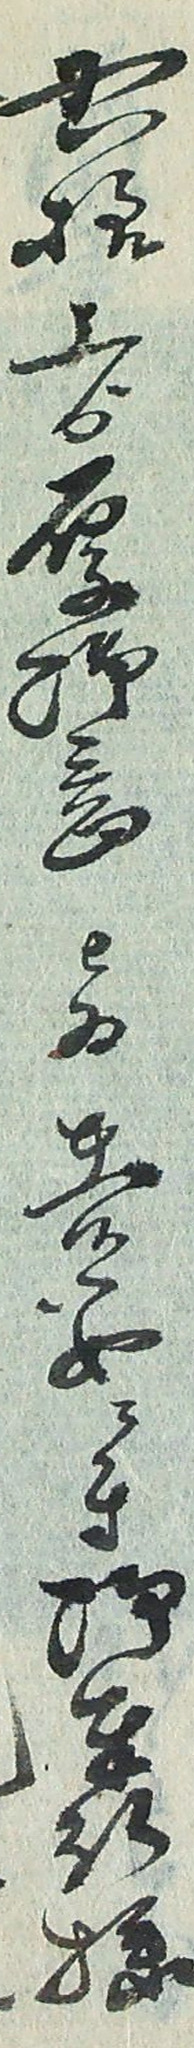右様上ゟ厚御意被為在候御義ニ付御奉行様
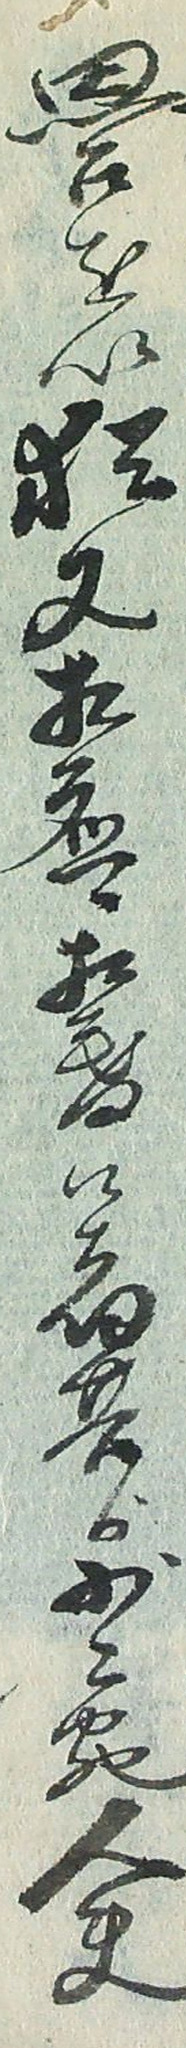思召を以猶又相應ニ相暮候者共ゟ少々宛人夫
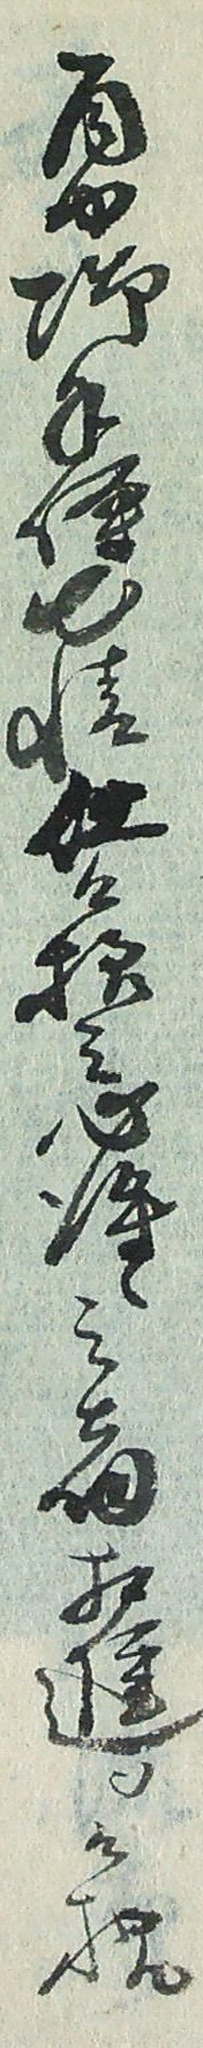自力御手傳出精仕候様之心得候之者相進メ候様
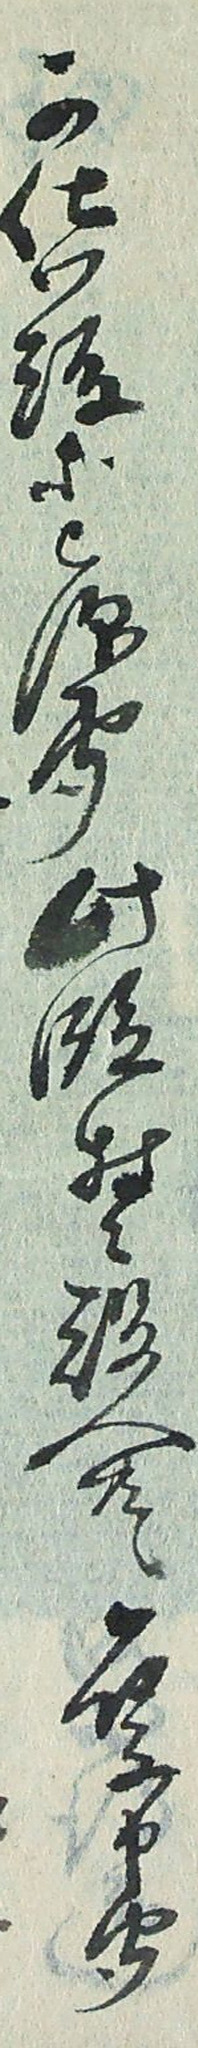可仕御趣等被仰聞此段村々役人共へ厚申聞
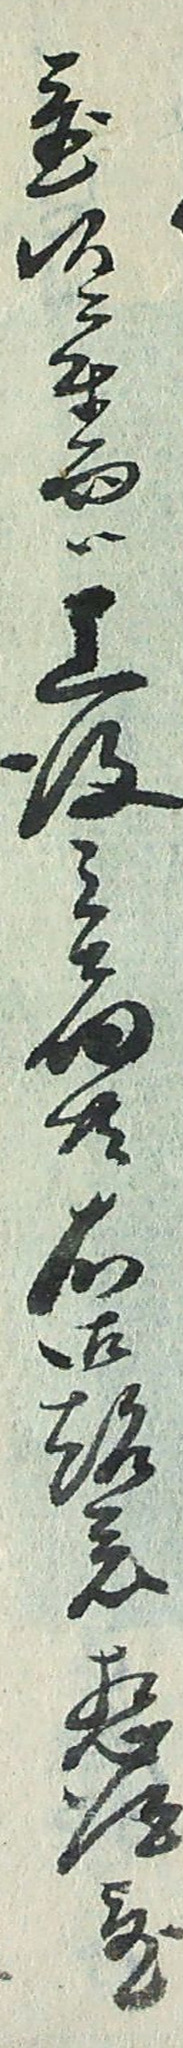置候ニ付而ハ上役之者共右御趣意相心得置
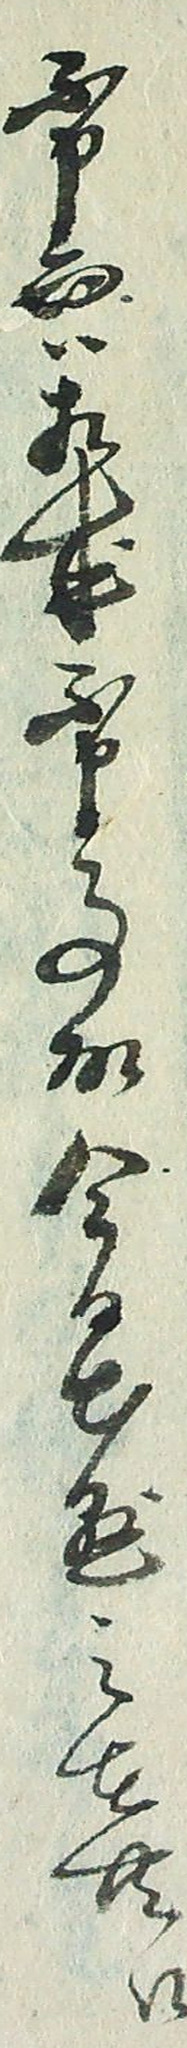不申而ハ相成不申事故今日出懸之者共江
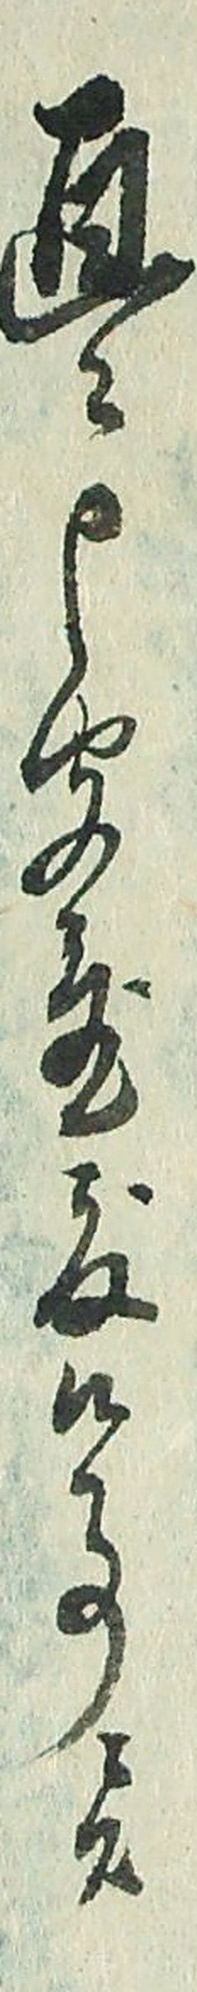直々申聞置度候事ニ候
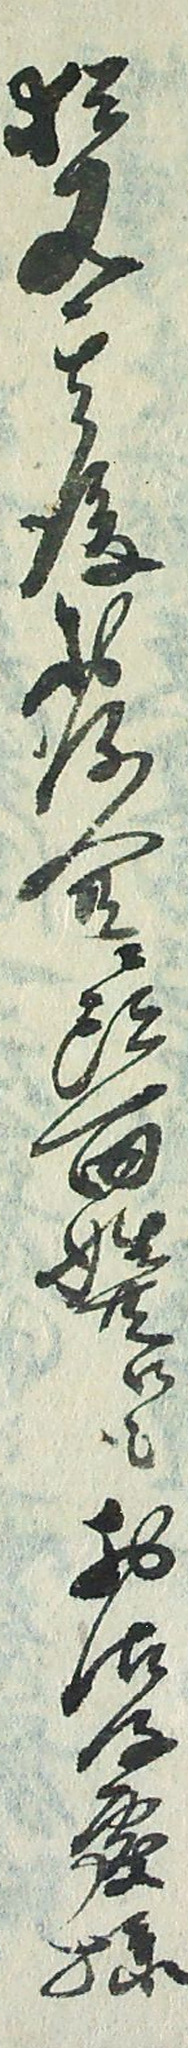猶又其後村役人共ニ頭百姓江も於御役處様
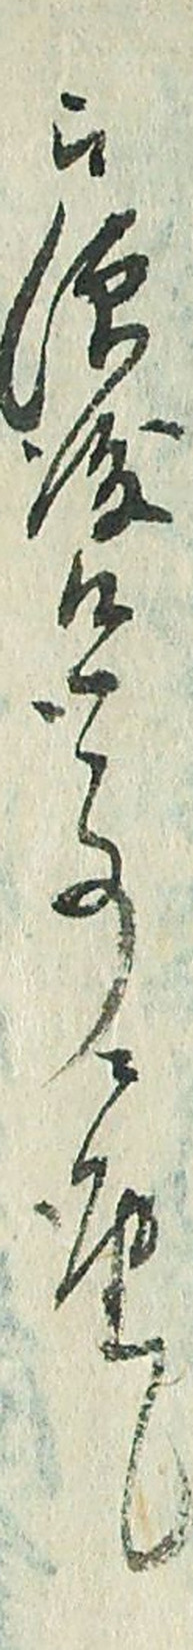被仰渡候御事ニ御坐候
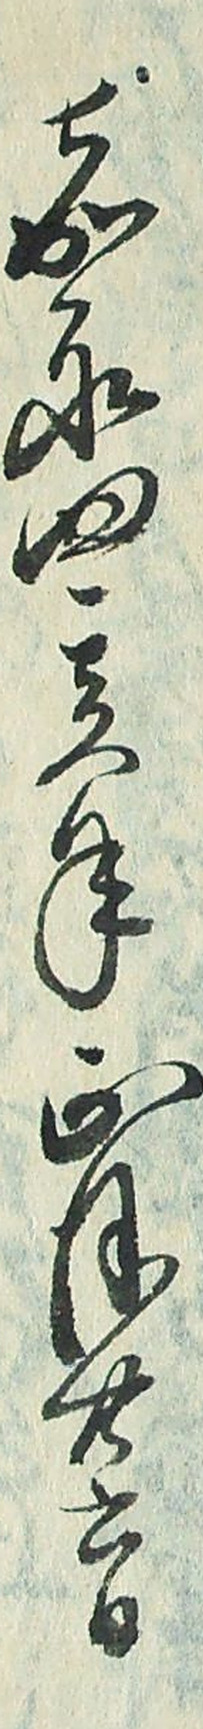嘉永四亥年正月廿六日

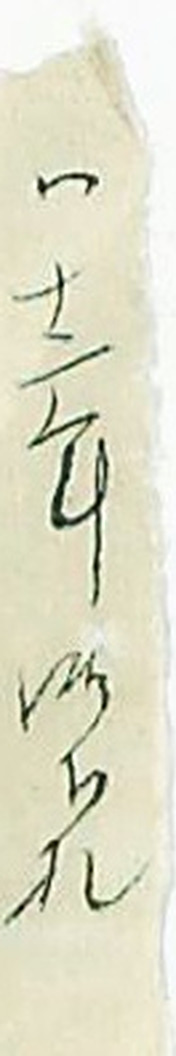同十二年御下札

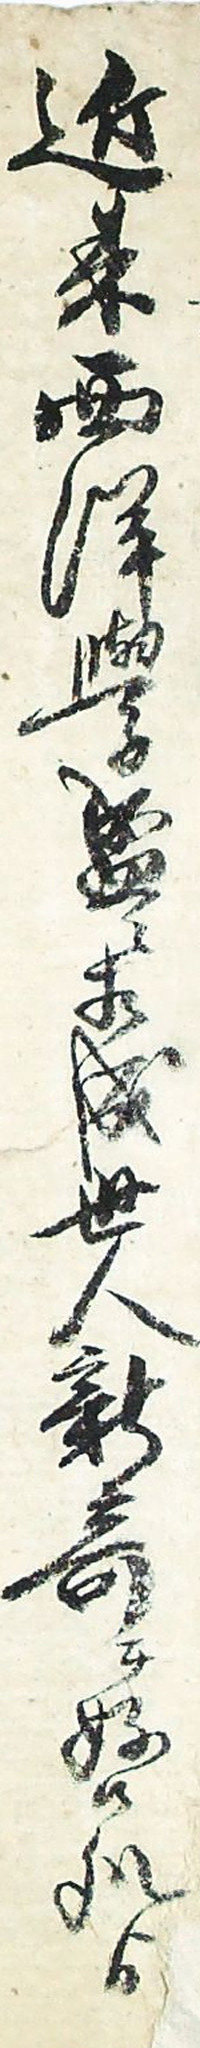近来西洋學盛ニ相成世人新奇ヲ好候処ゟ
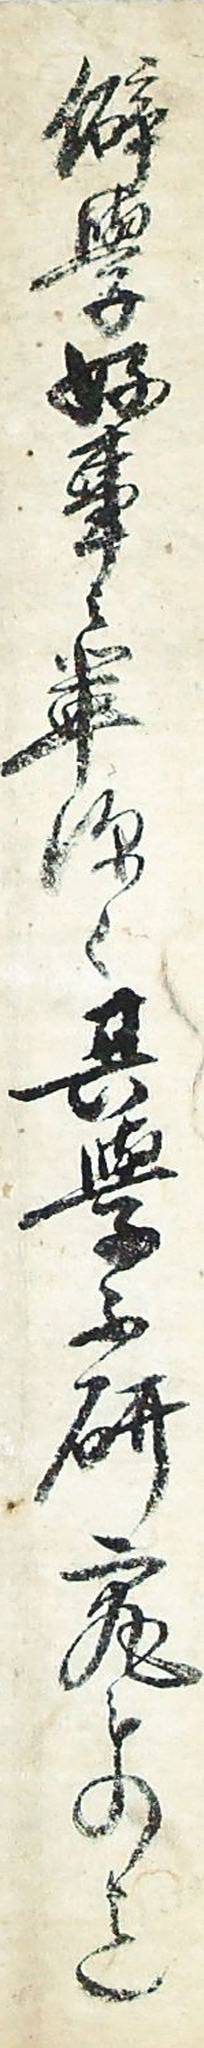僻學好事之輩深く其學不研究もの迄
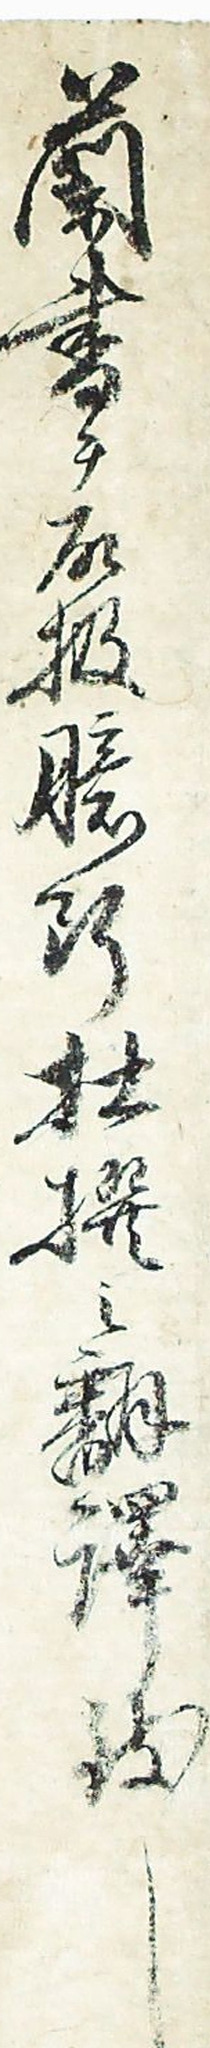蘭書ヲ取扱臆断杜撰之翻譯致し
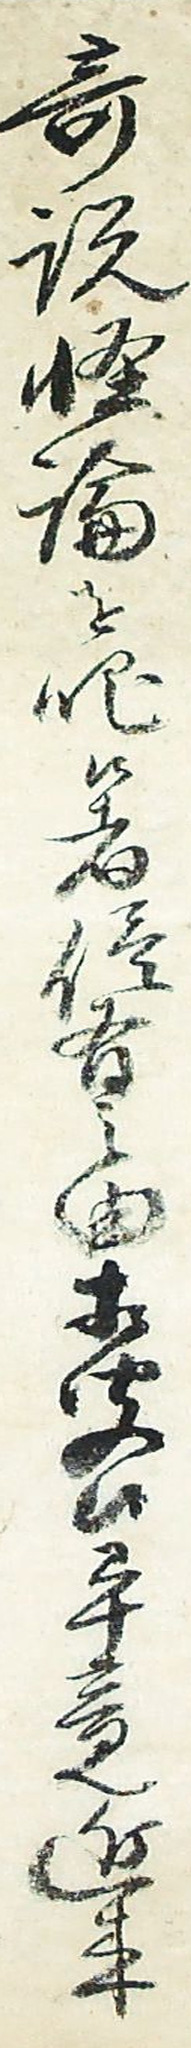奇説怪論を唱候者侭有之由相聞候畢竟近来
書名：諸御趣意書并御下知向之写
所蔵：鳴門教育大学 Naruto University of Education
